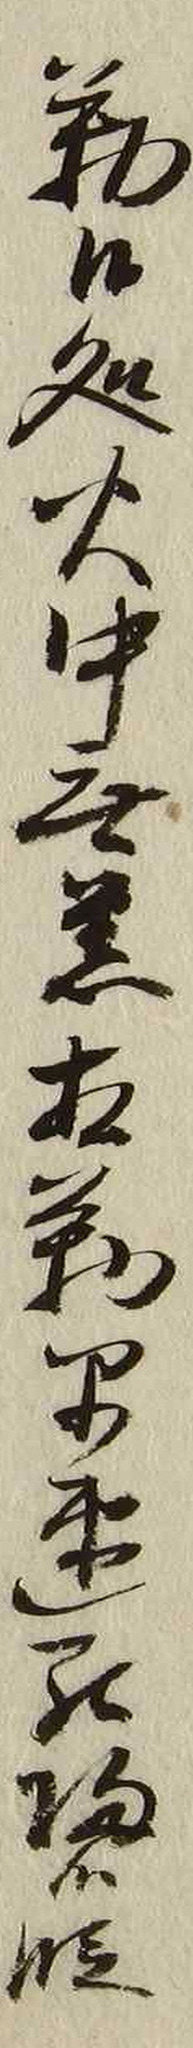勤候処火中無恙相勤早速罷帰候段
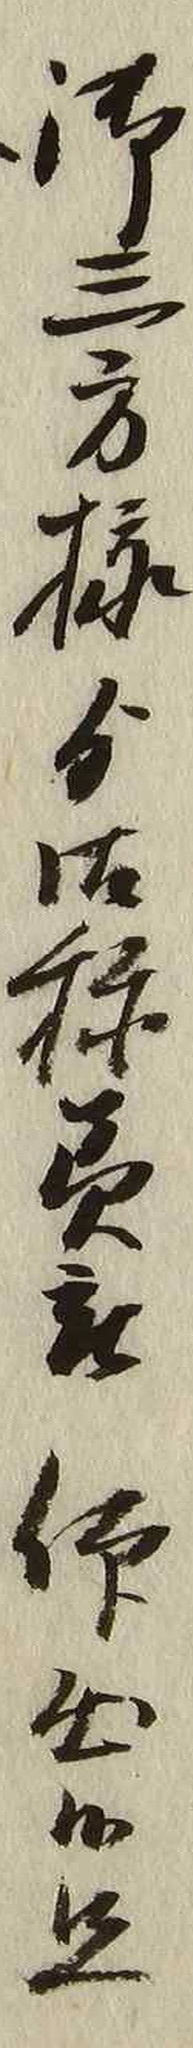御三方様ゟ御称美被仰出候且
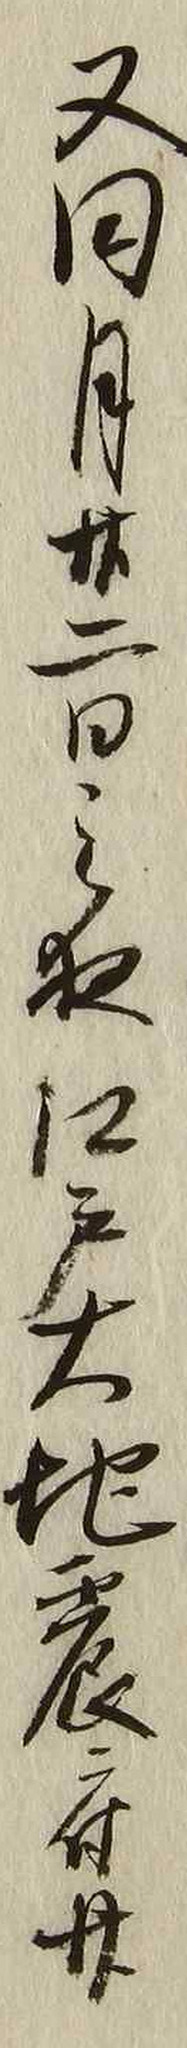又同月廿二日之夜江戸大地震ニ付廿
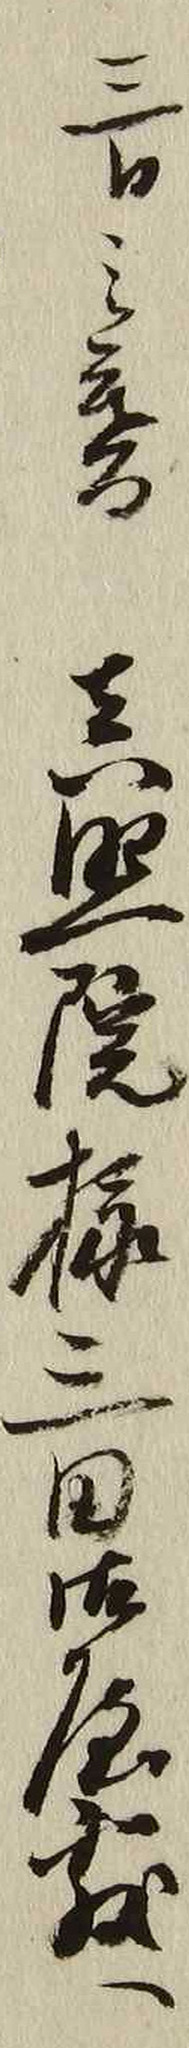三日之暮真照院様三田御屋敷へ
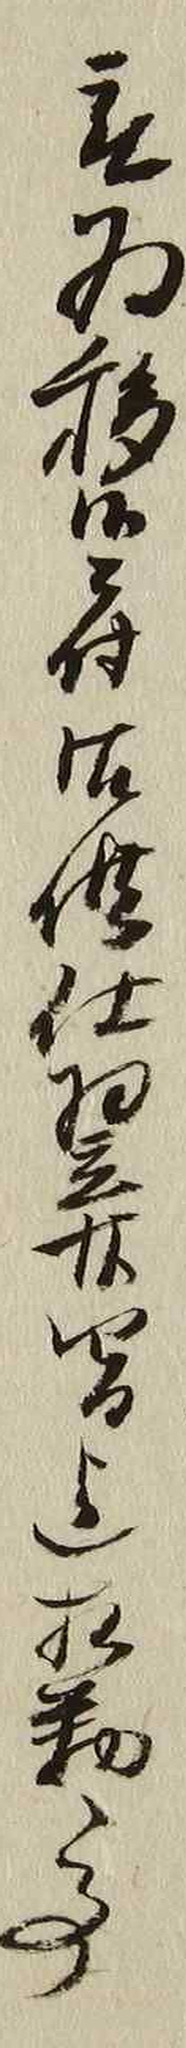被為移候ニ付御供翌廿四日迄相勤候事
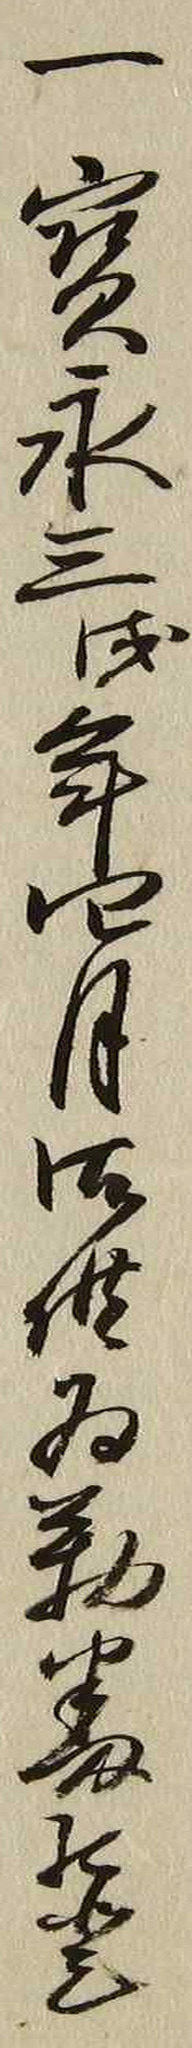一宝永三戌年四月御供為勤番罷登
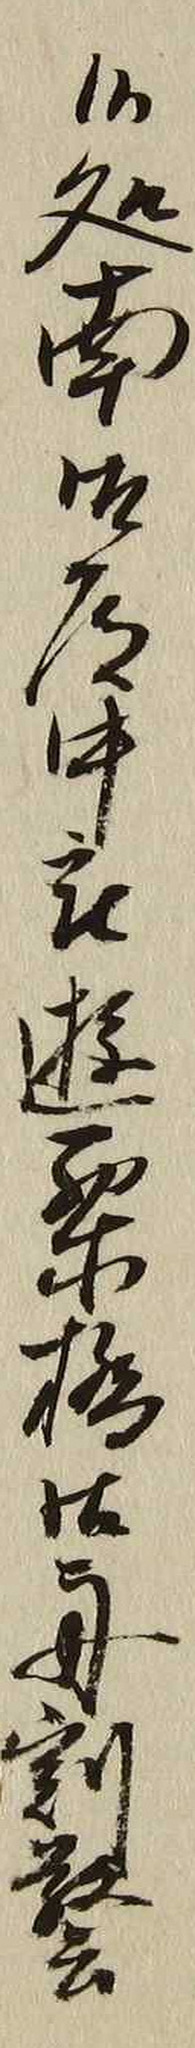候処南御道中被遊栗橋御舟割警
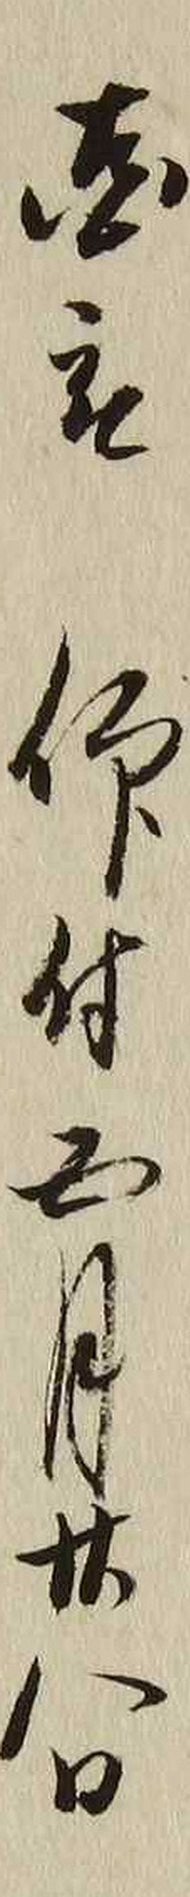固被仰付五月廿八日
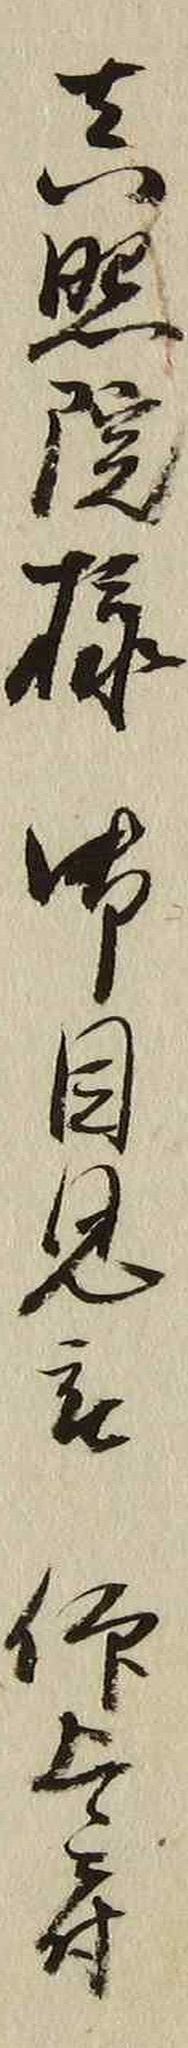真照院様御目見被仰上ニ付
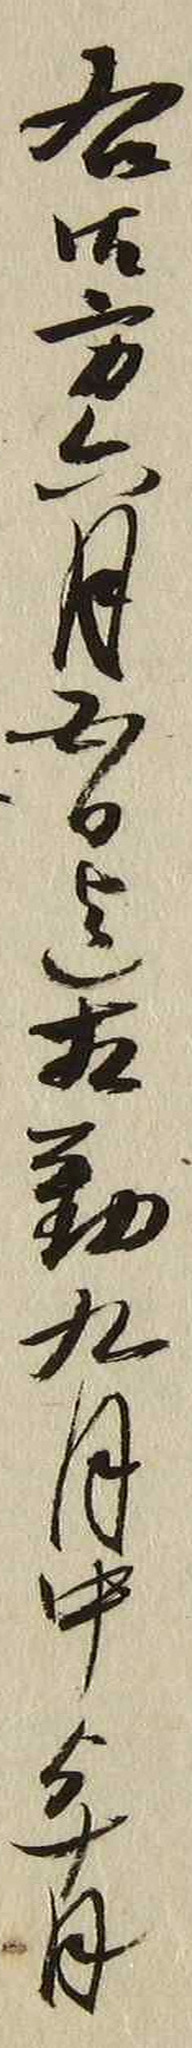右御方六月五日迄相勤九月中ゟ十月
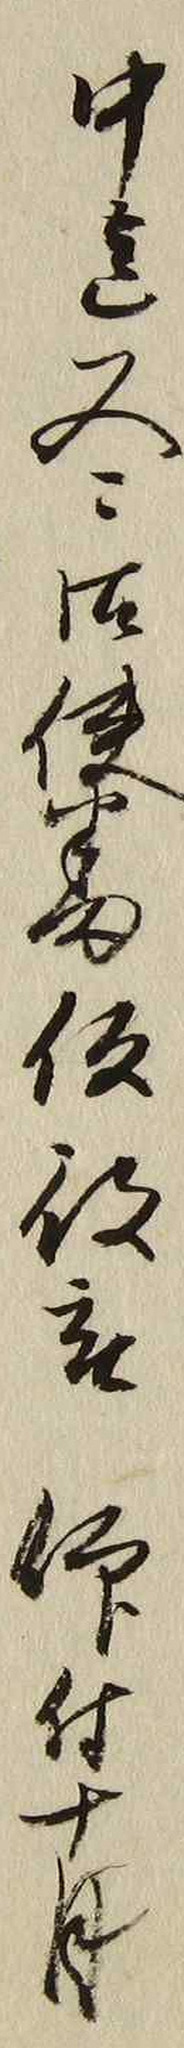中迄又々御使番仮役被仰付十月
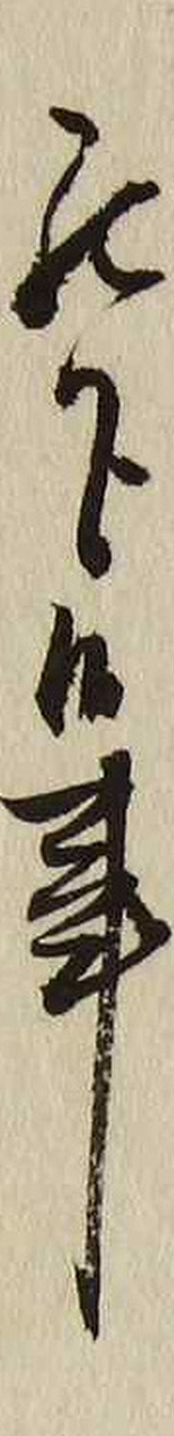罷下候事
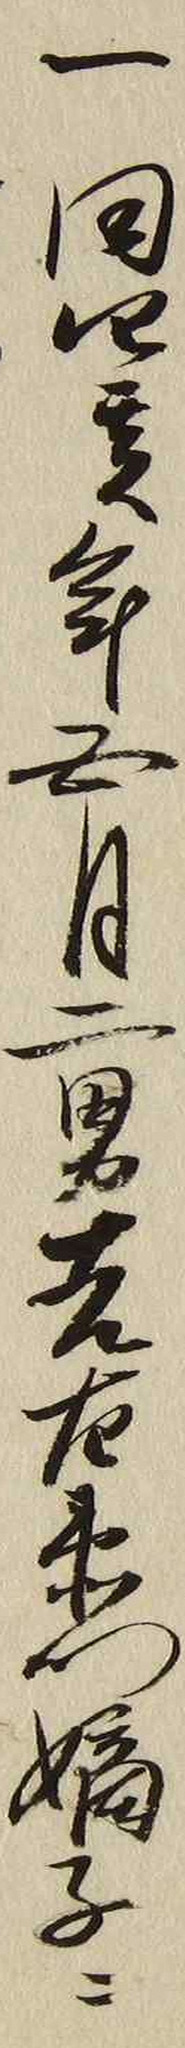一同四亥年五月二男吉左衛門嫡子ニ
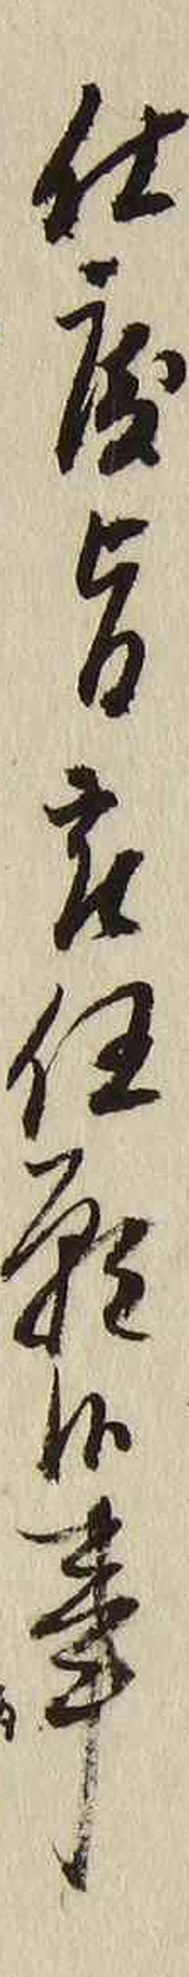仕度旨被任願候事

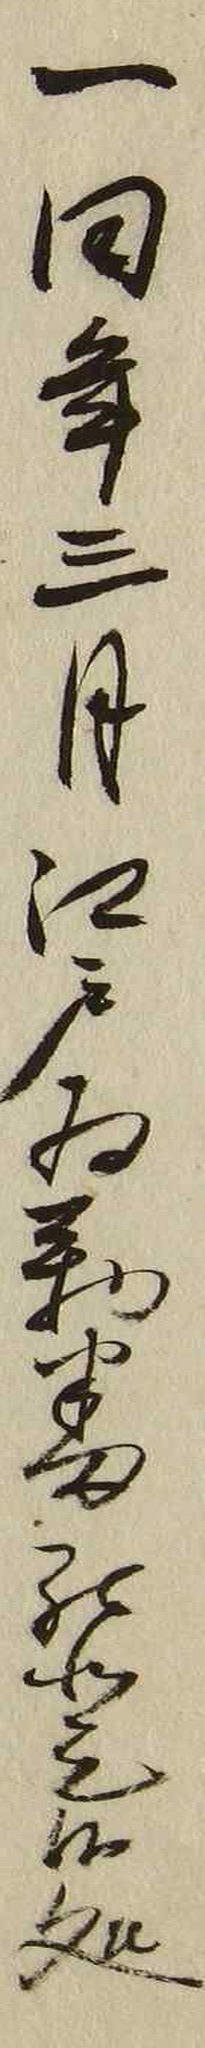一同年三月江戸為勤番罷登候処
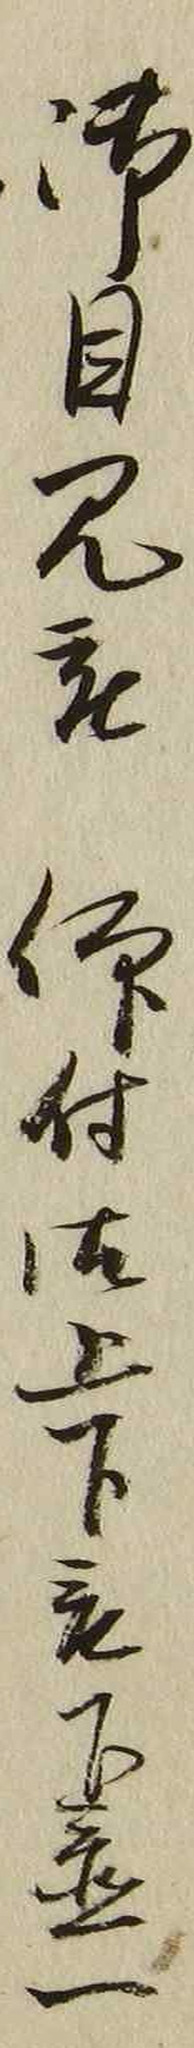御目見被仰付御上下被下置一
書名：諸士系譜　巻之356　す之部6
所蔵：会津若松市立会津図書館
